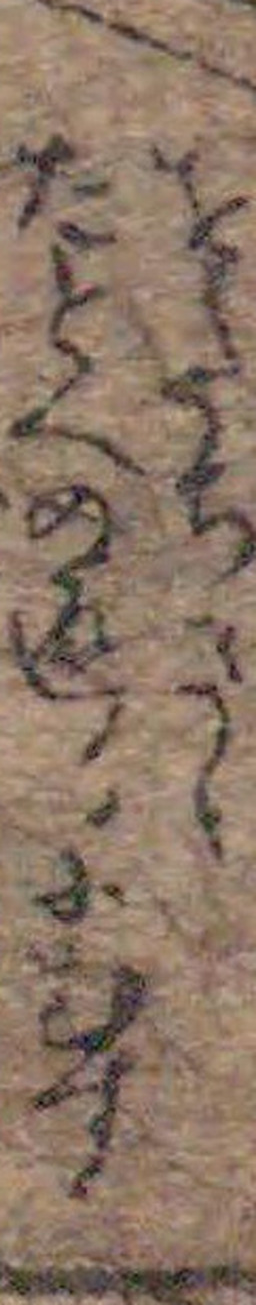たとへの通りにむす
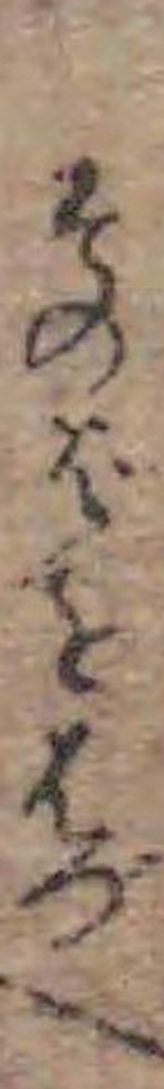そのばをはづ
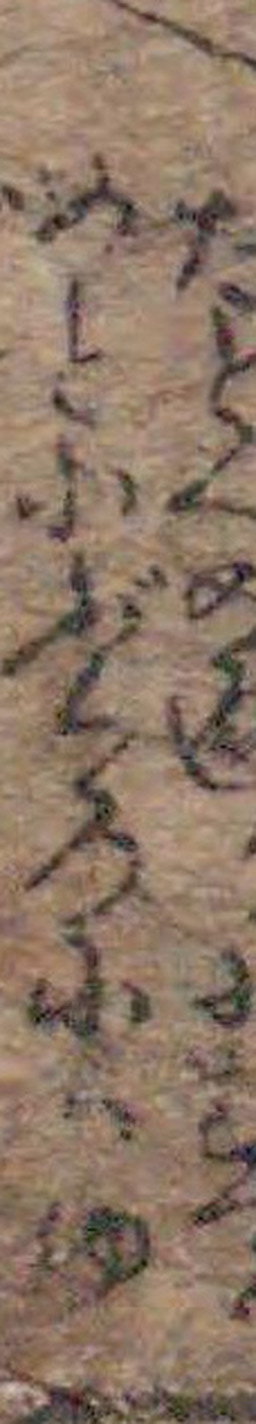めと小ぶくろにはゆ
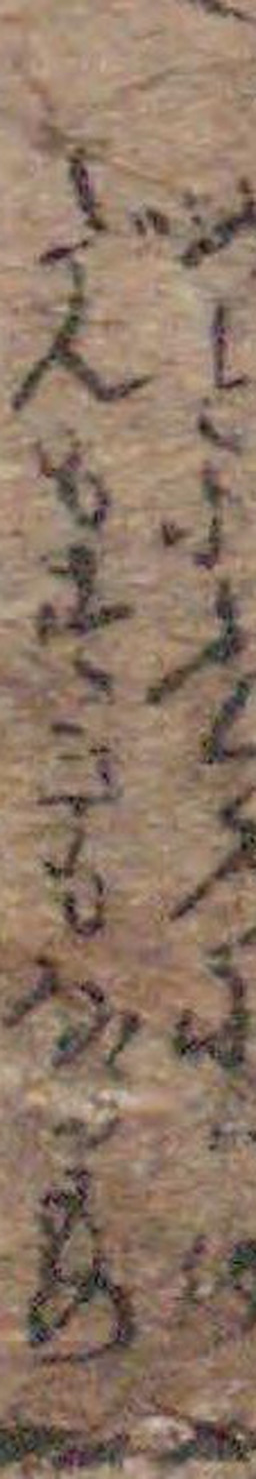だんもすきもなきもの
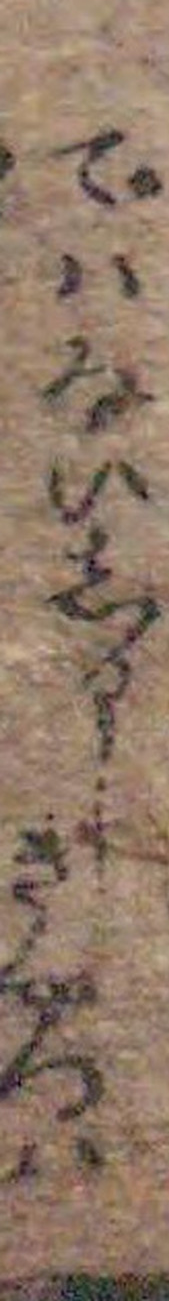ではないしるしきやつは
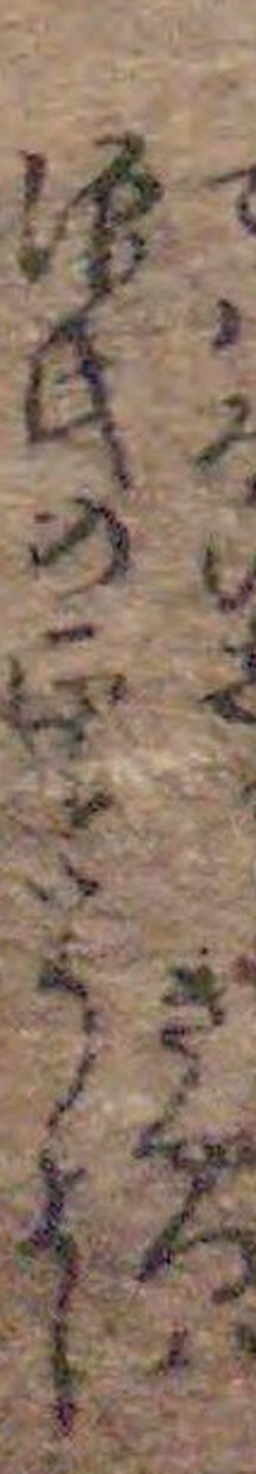源氏の正とうよし
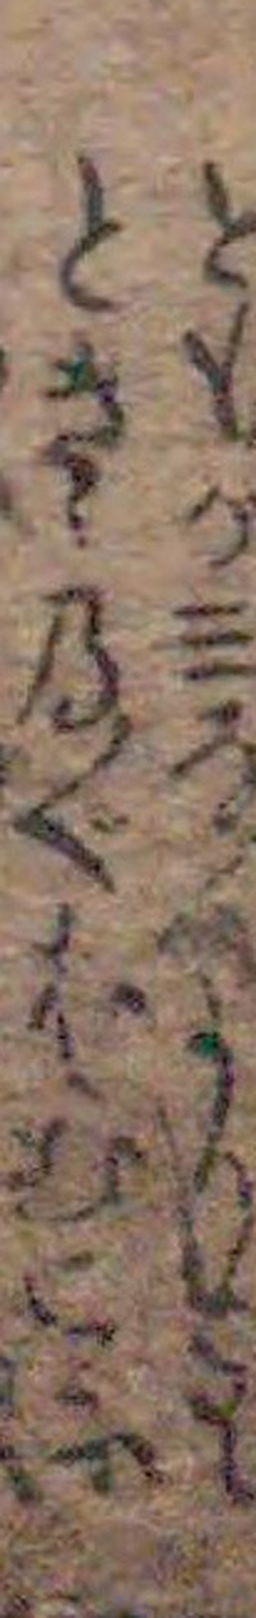ときゝ及べばむこに
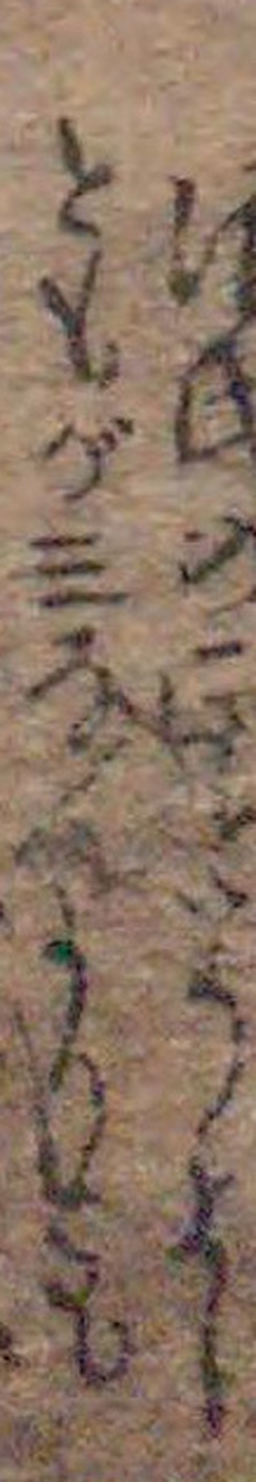ともが三なんよりとも

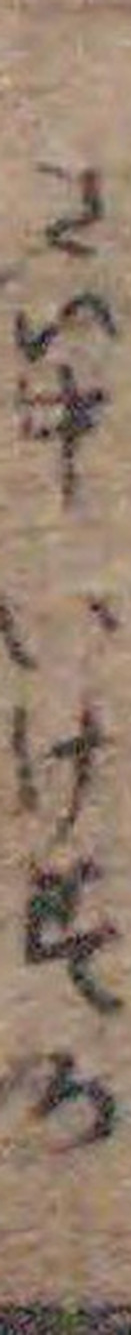さい中いけすか
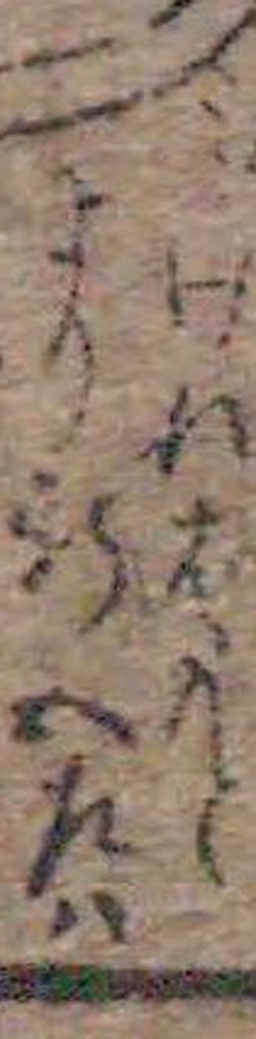より新御左は
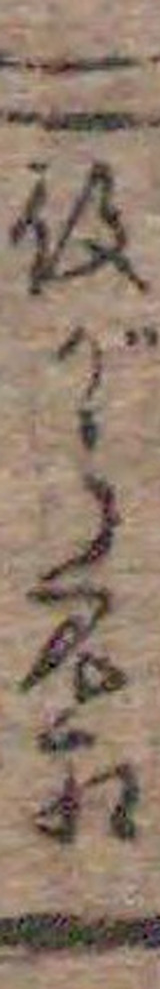役がら不相
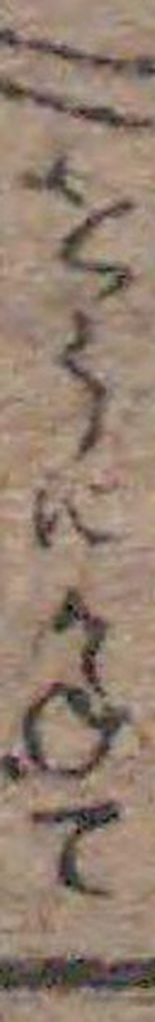をうにかねて
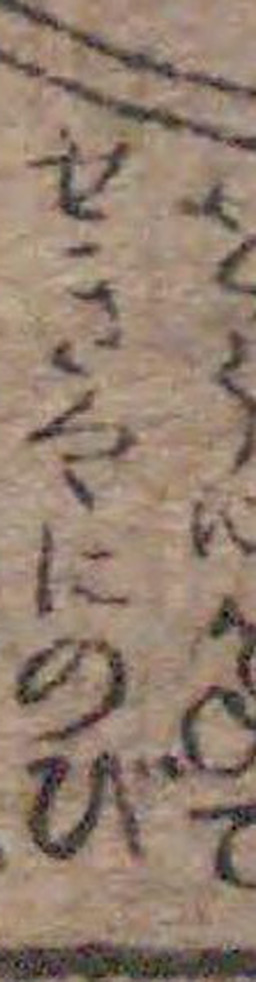せきやにのび
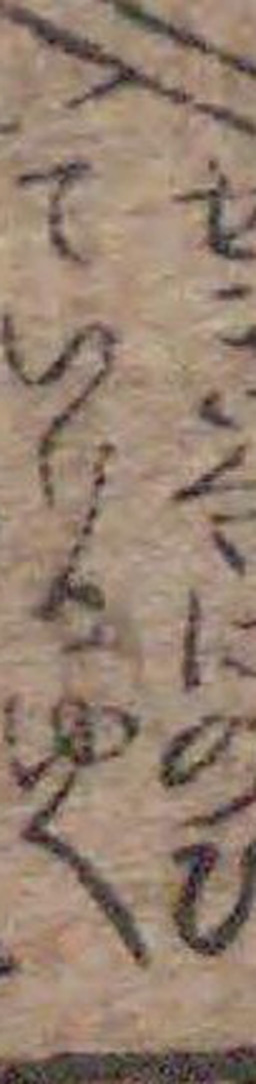ていけるゆへ
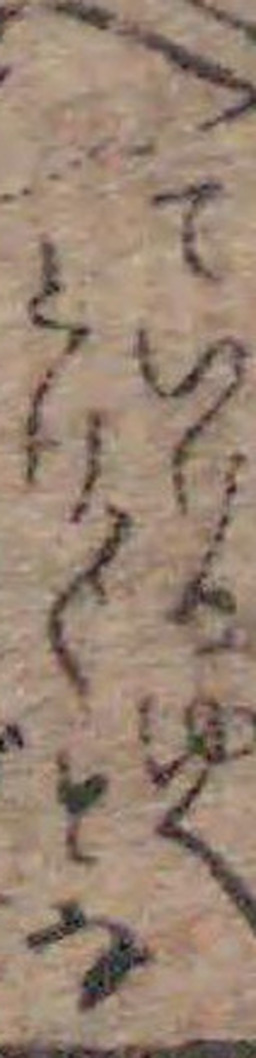とけ〳〵とな
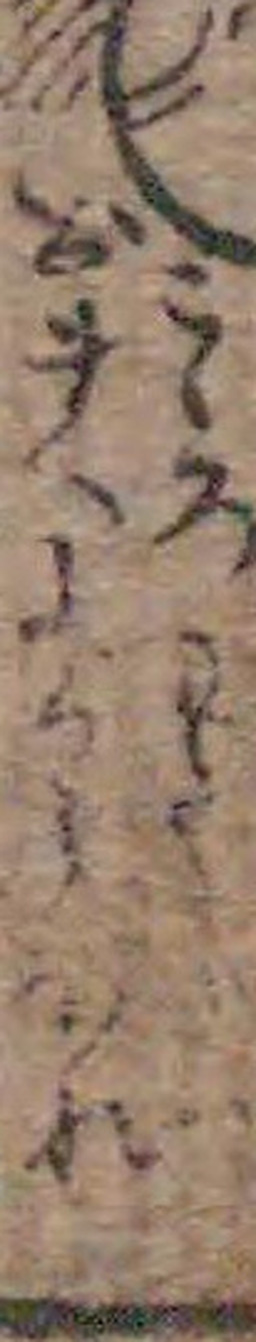おまへにかうほれ
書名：三舛増鱗組 : 3巻
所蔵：国立国会図書館 National Diet Library, JAPAN
